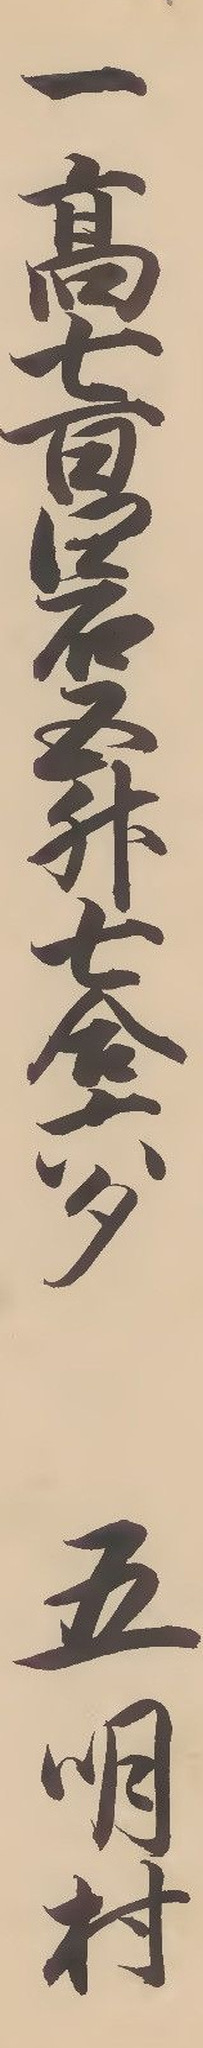一高七百四石五升七合六勺五明村
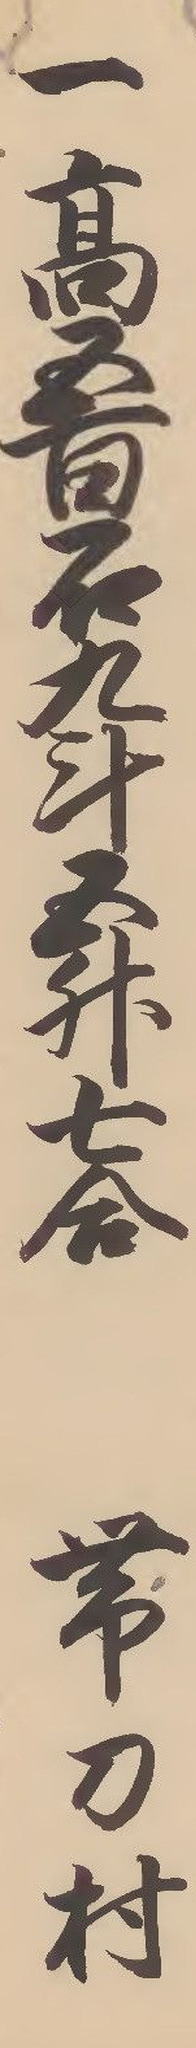一高五百石九斗五升七合帯刀村

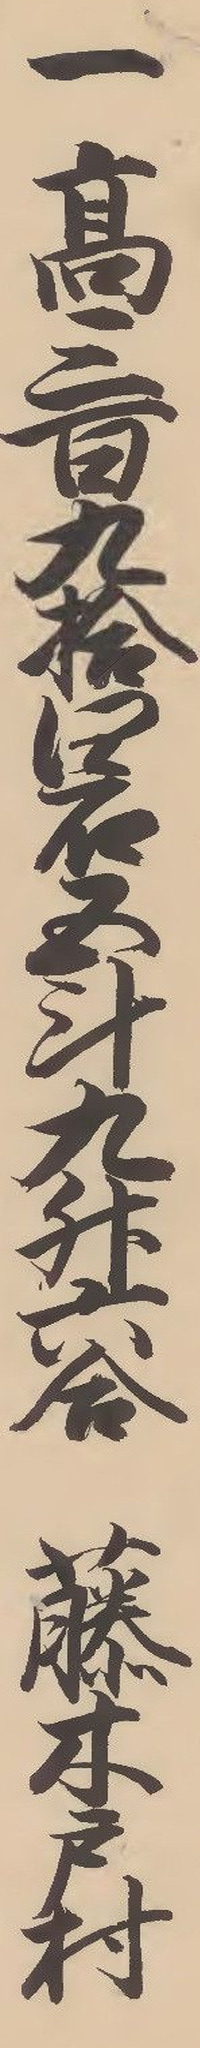一高三百九拾四石五斗九升六合藤木戸村
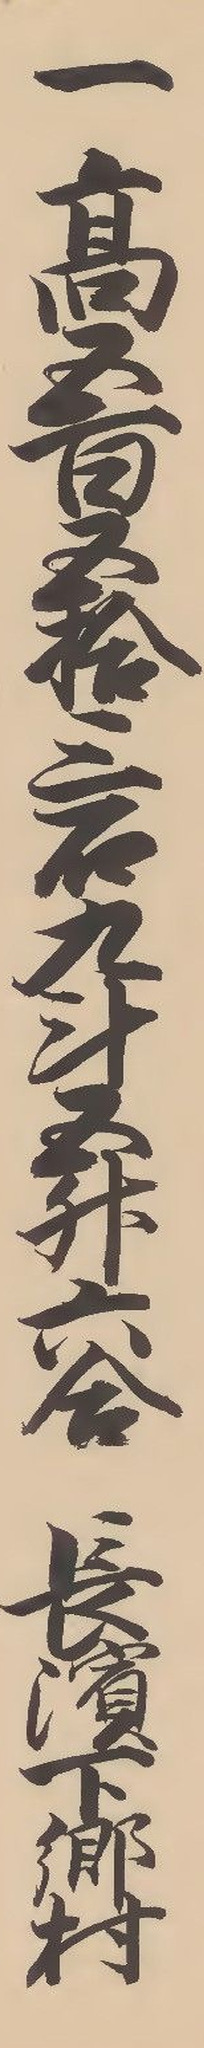一高五百五拾三石九斗五升六合長濱下郷村
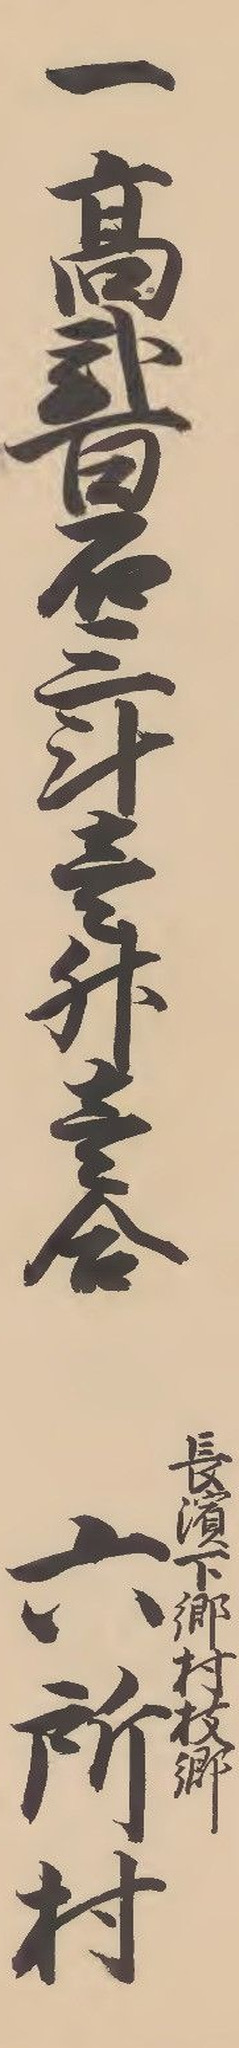一高弐百石三斗壱升壱合六所村
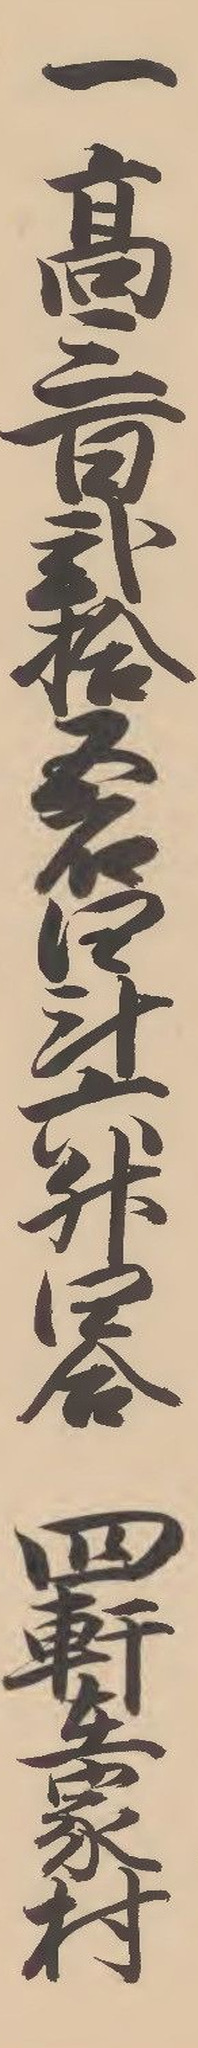一高三百弐拾五石四斗六升四合四軒在家村
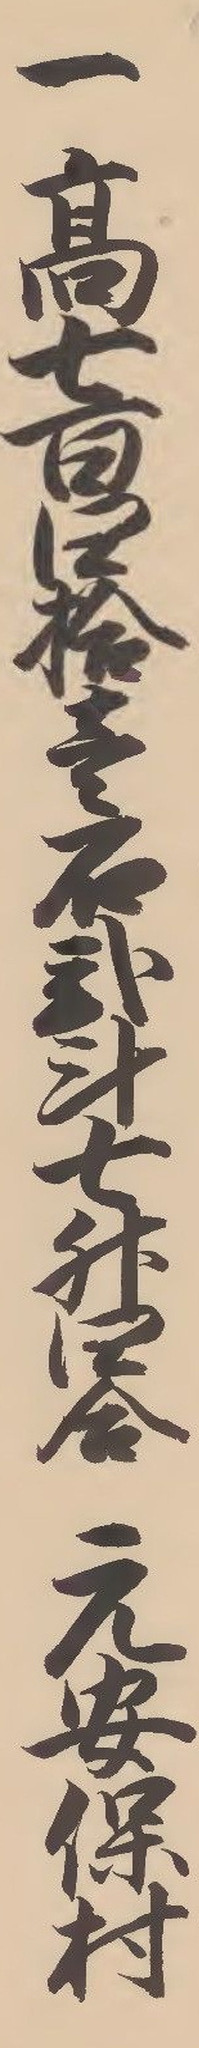一高七百四拾壱石弐斗七升四合元安保村
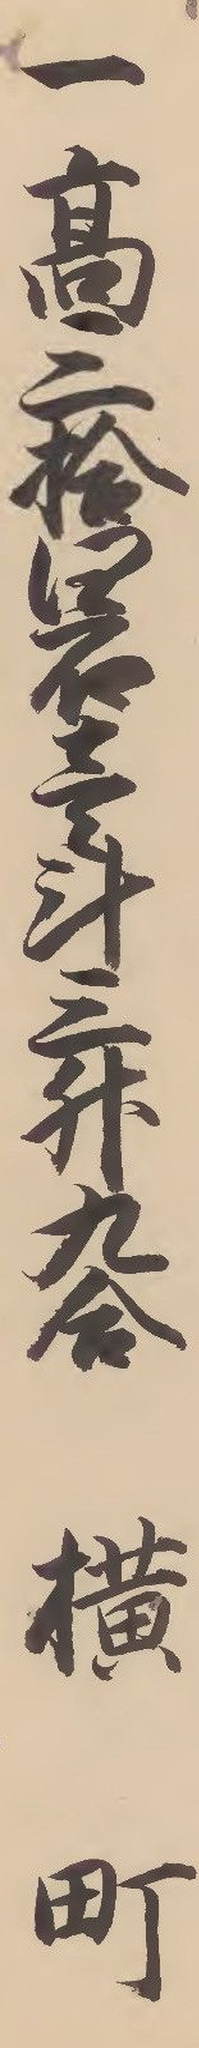一高三拾四石壱斗三升九合横町

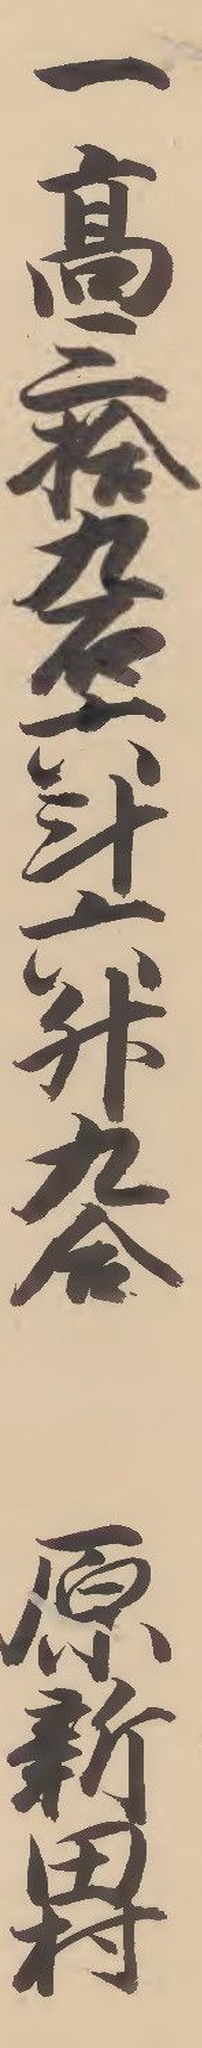一高三拾九石六斗六升九合原新田村
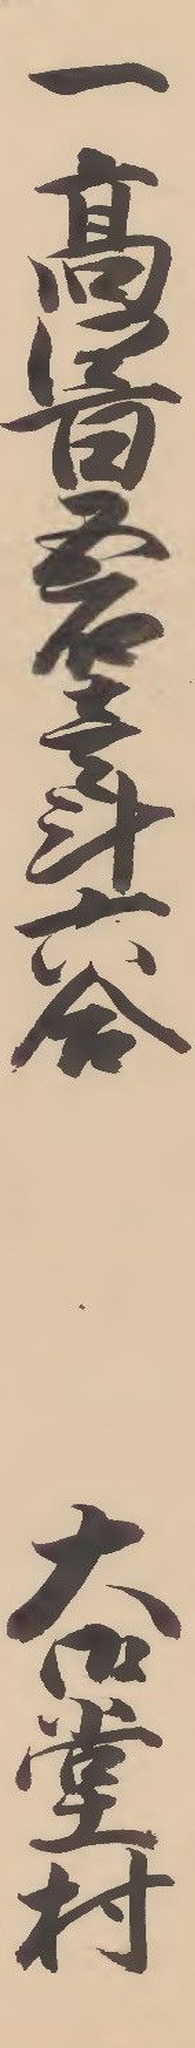一高四百五石壱斗六合大御堂村
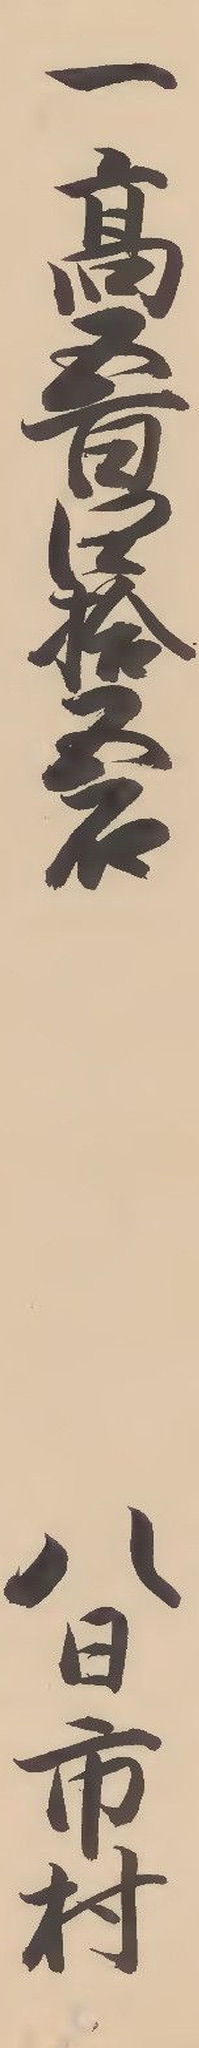一高五百四拾五石八日市村
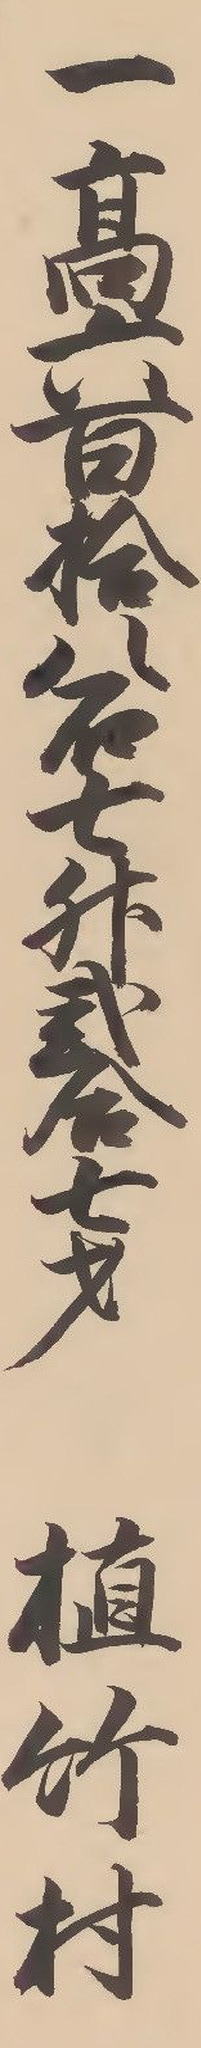一高六百拾八石七升弐合七才植竹村
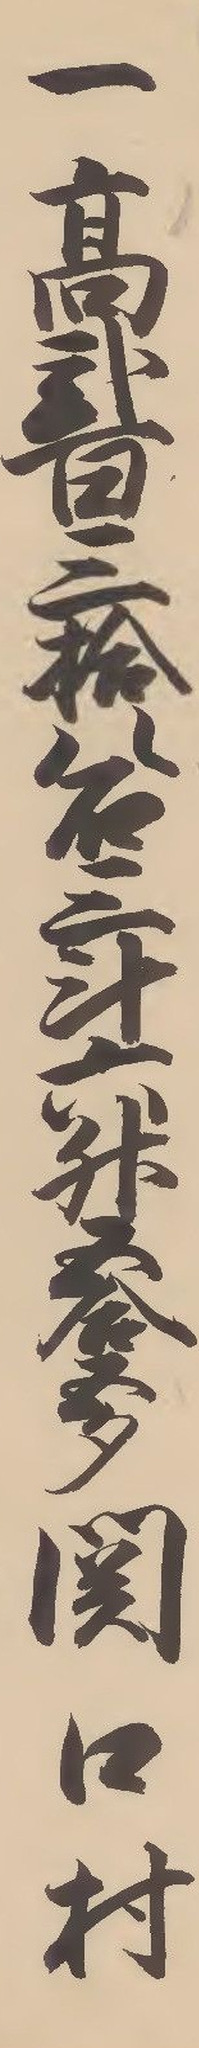一高弐百三拾八石三斗六升五合五勺関口村
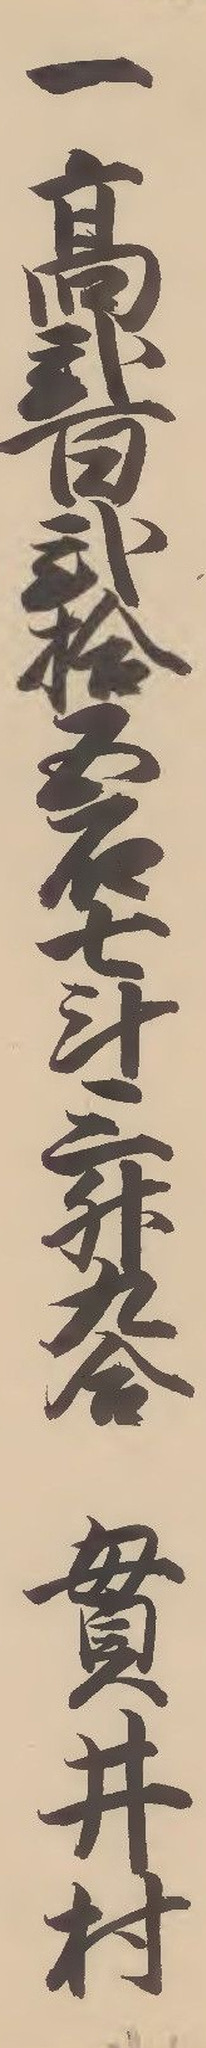一高弐百弐拾五石七斗三升九合貫井村
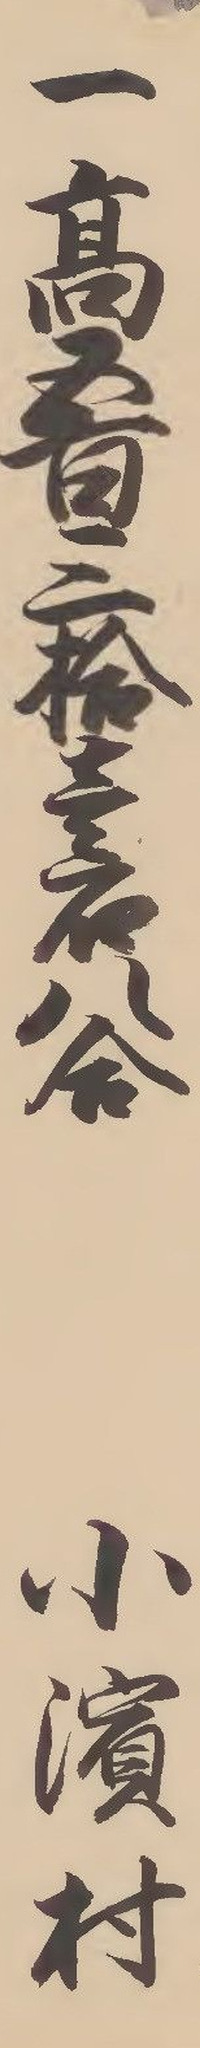一高五百三拾壱石八合小濱村
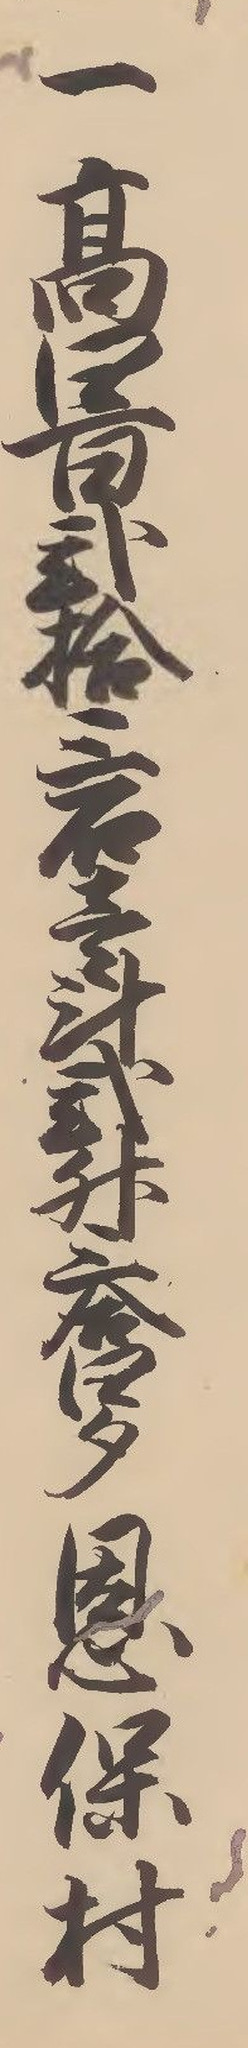一高四百弐拾三石壱斗弐升三合四勺恩保村
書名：武蔵国郷帳　下
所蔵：国立公文書館 National Archives of Japan
